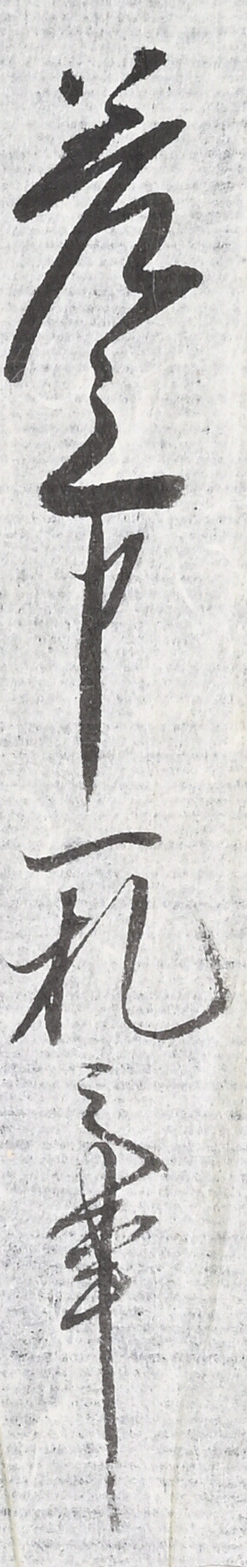差上申一札之事
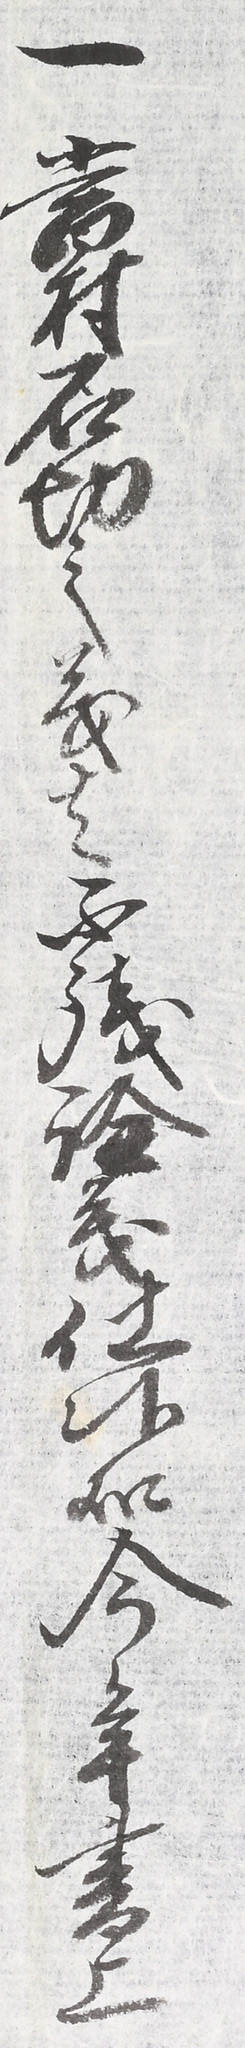一当村石切之義は不残詮義仕候処今年書上
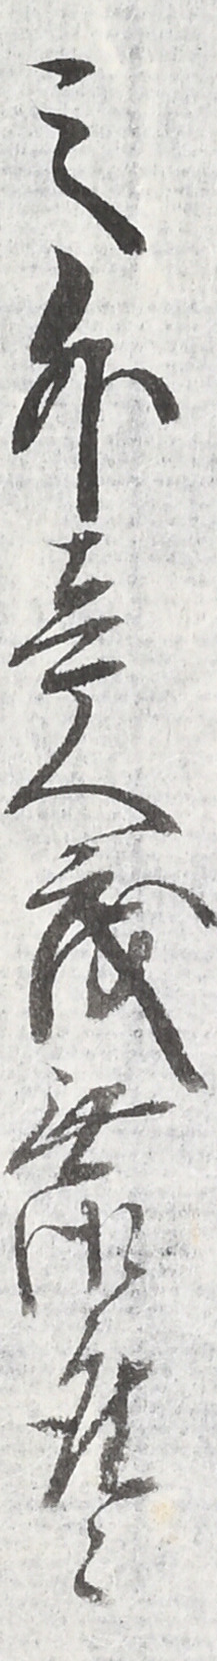之外壱人も無御座候
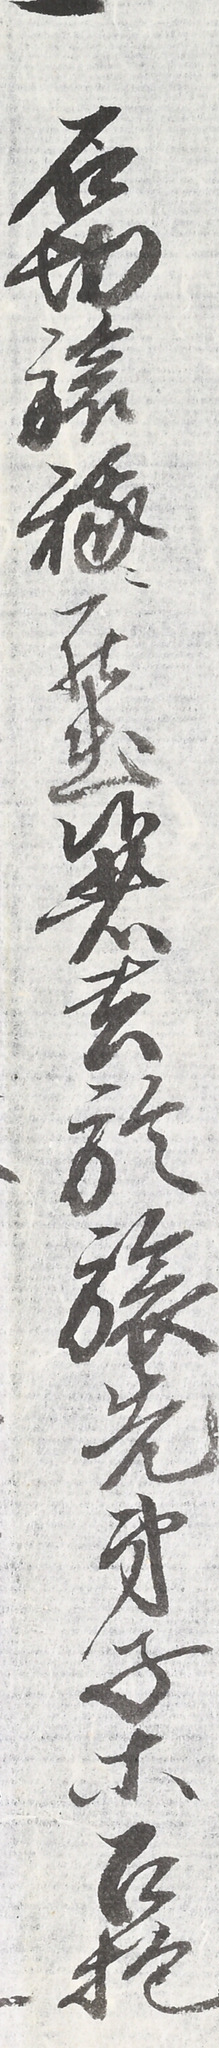一石切旅稼に罷出候者共於旅先弟子等召抱
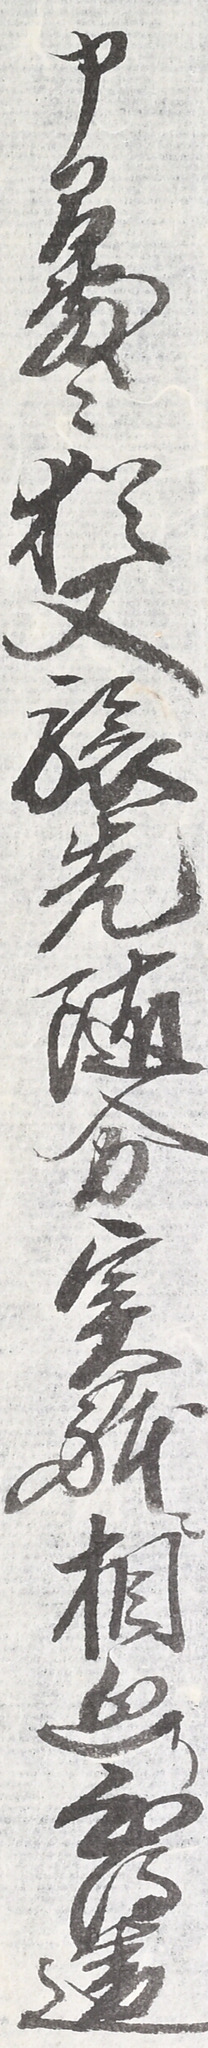申間敷候猶又旅先随分実体に相廻り心得違
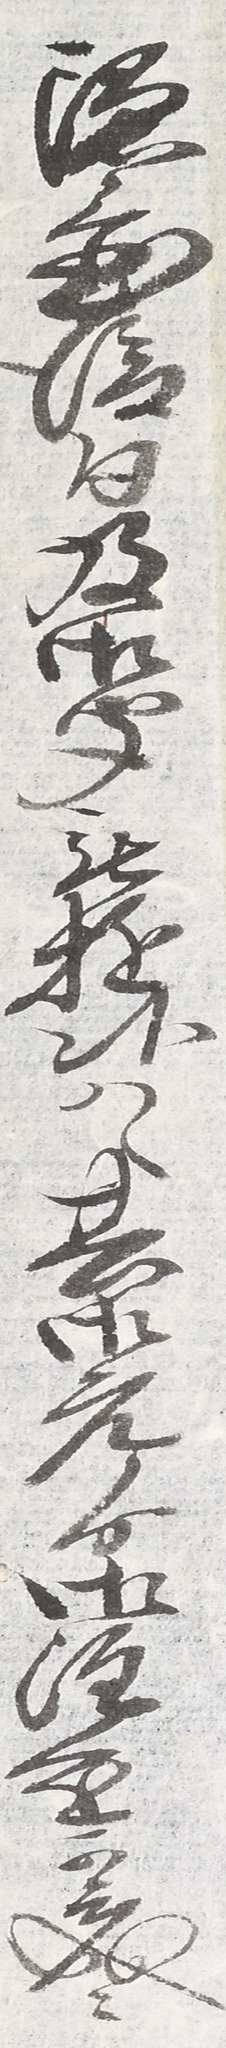隠置後日及御聞被遊候ハヽ其御元ゟ御注進可被成候
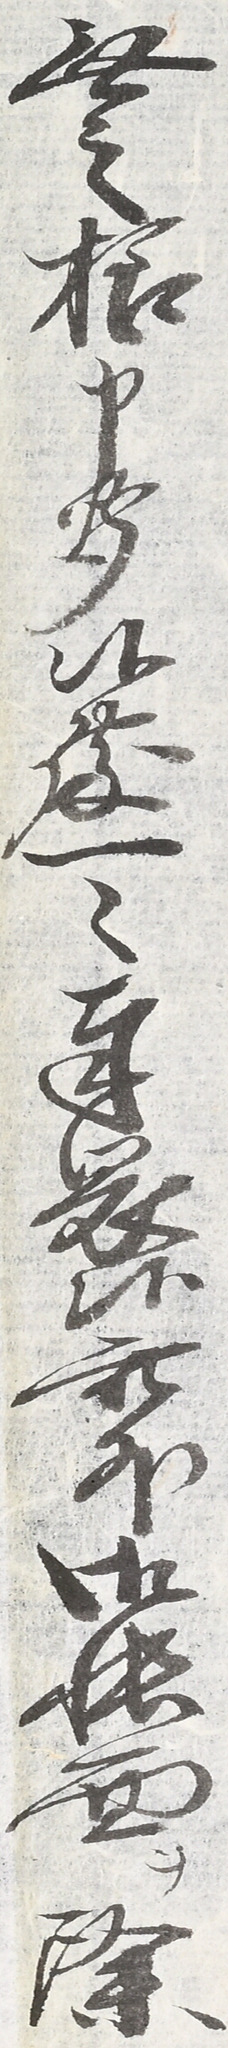無之様申聞候処一々奉畏候此外御帳面を除
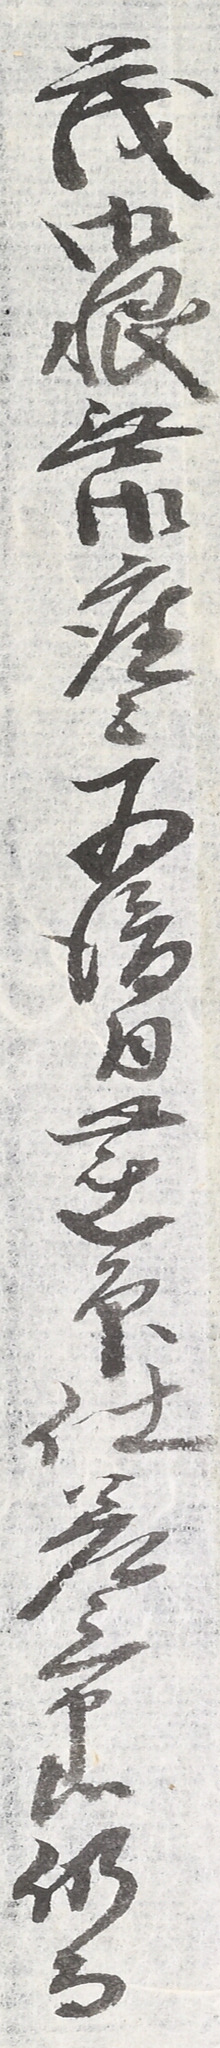も御恨無御座候為後日蓮印仕差上申候仍て
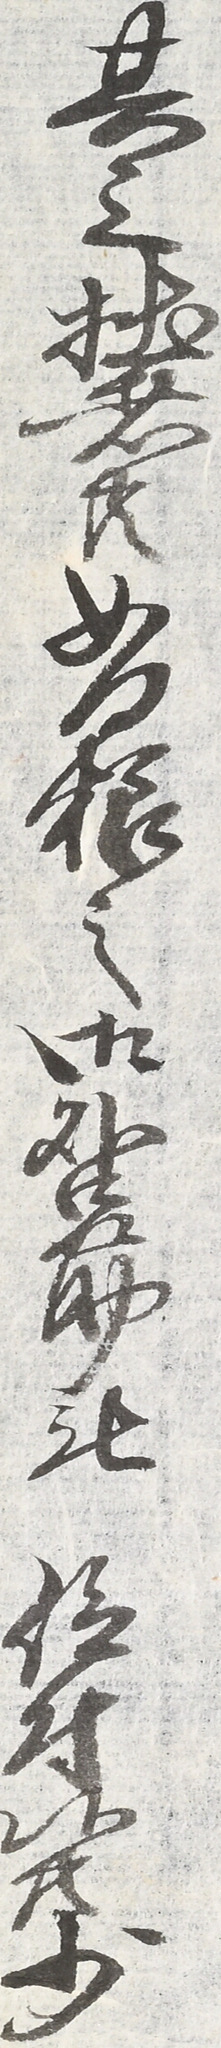其上拙者共如何様之御咎筋被仰付候共少
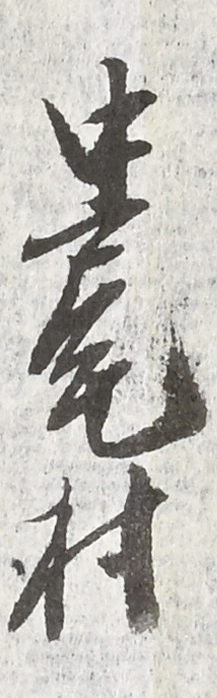中尾村
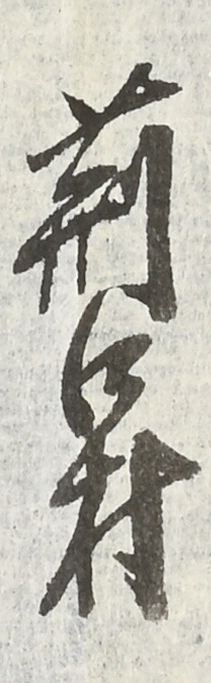荊口村
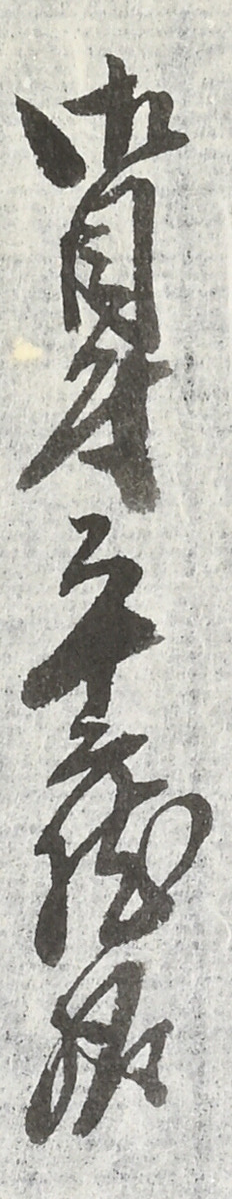御目付平蔵様
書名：差上申一札之事
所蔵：伊那市立高遠町図書館・合同会社AMANE
